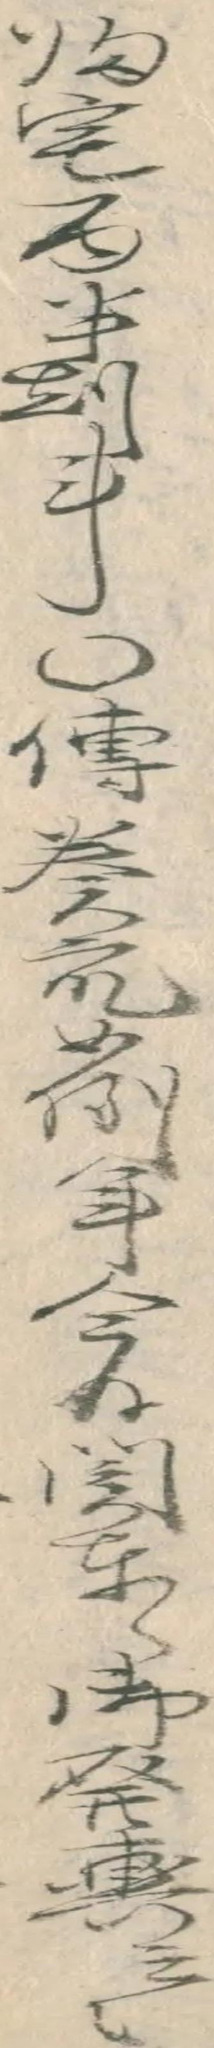帰宅酉半刻斗○傳奏衆如例年今日関東へ御発輿云々
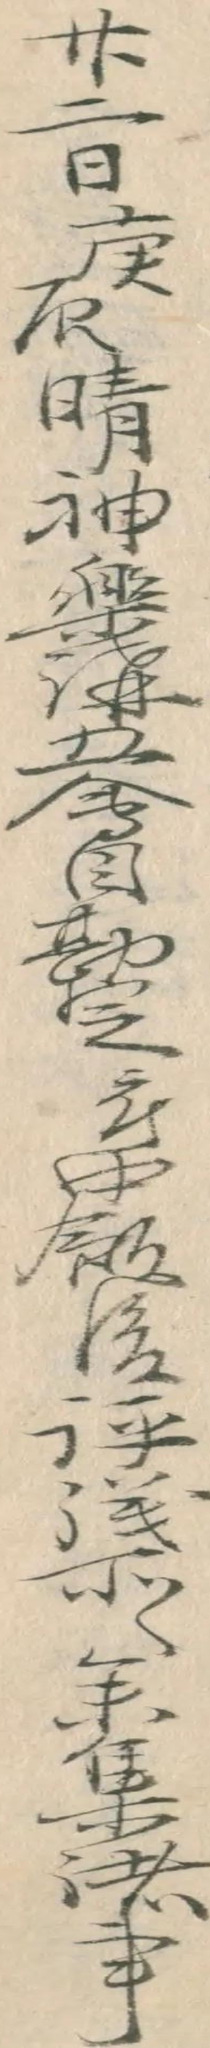廿二日庚辰晴神楽講五會目勘定ニ付中飯後評議所へ参集諸事

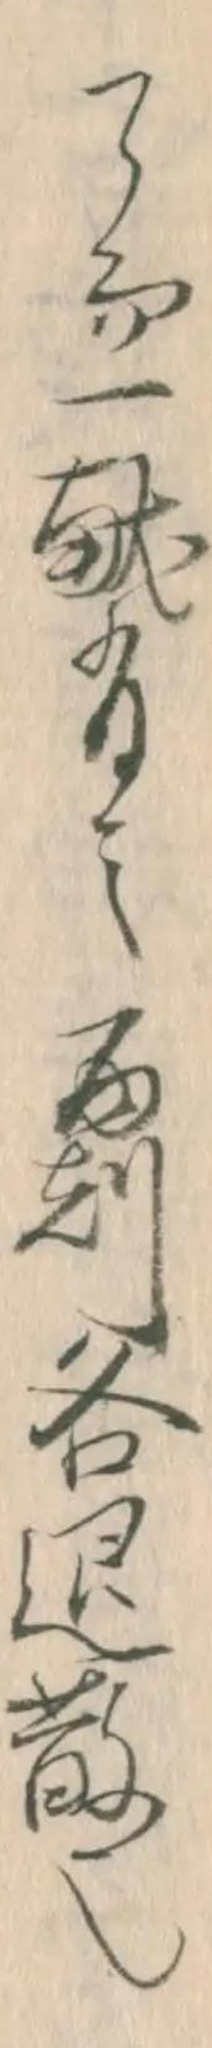了而一献有之酉刻各退散也
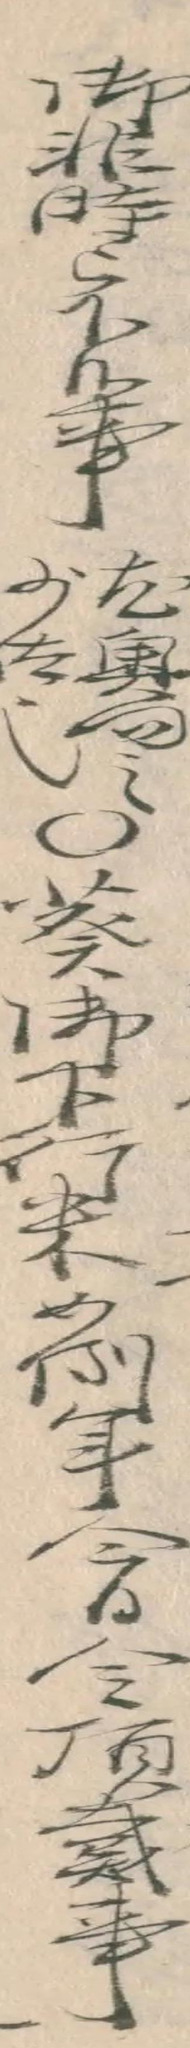御非時被下候事尤奥向之沙汰也○葵御下行米如例年今日令頂戴事
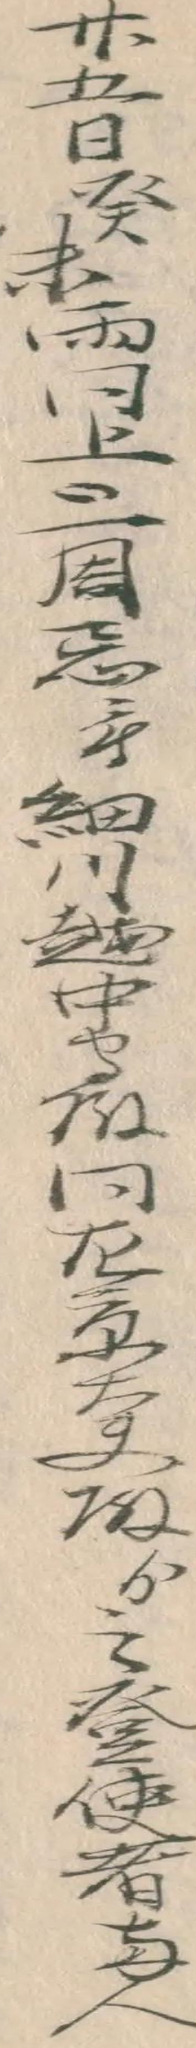廿五日癸未雨同上御一周忌ニ付細川越中守殿同左京大夫殿ゟ之登使者両人
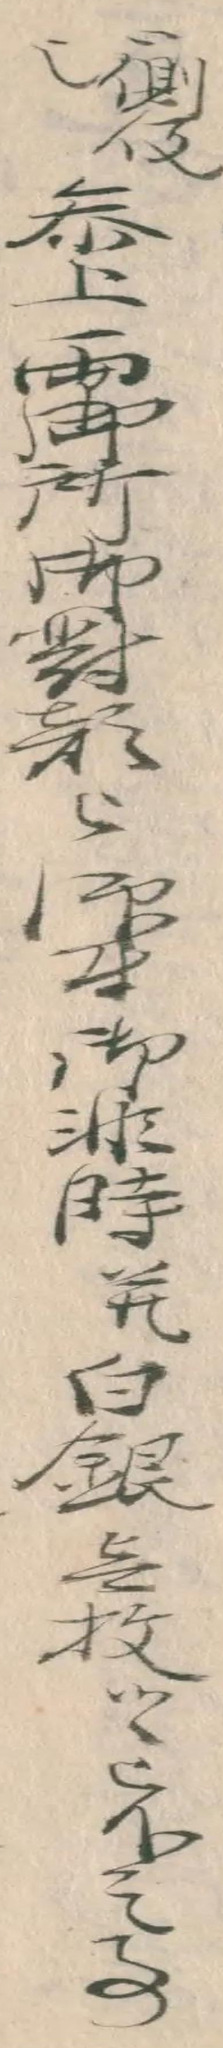御側役也参上両御所御對顔被仰付御非時并白銀壱枚ツヽ被下之事
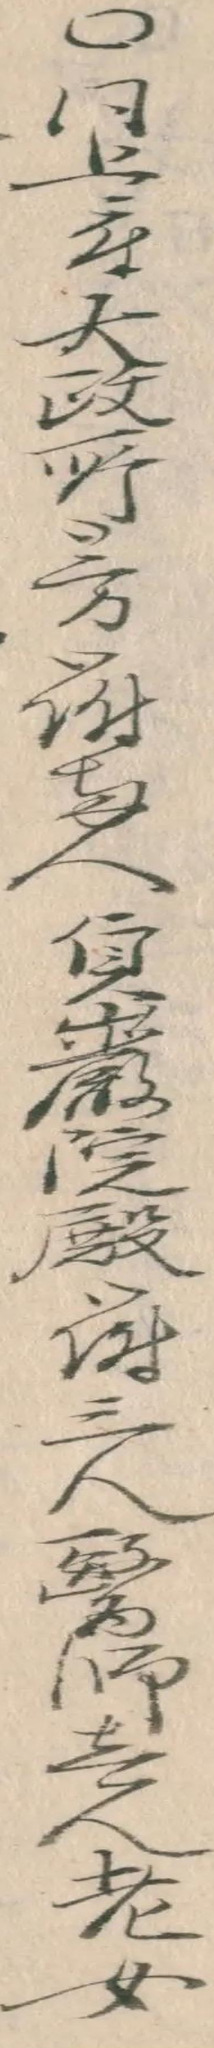◯同上ニ付大政所御方御附両人貞巌院殿御附三人醫師壱人老女
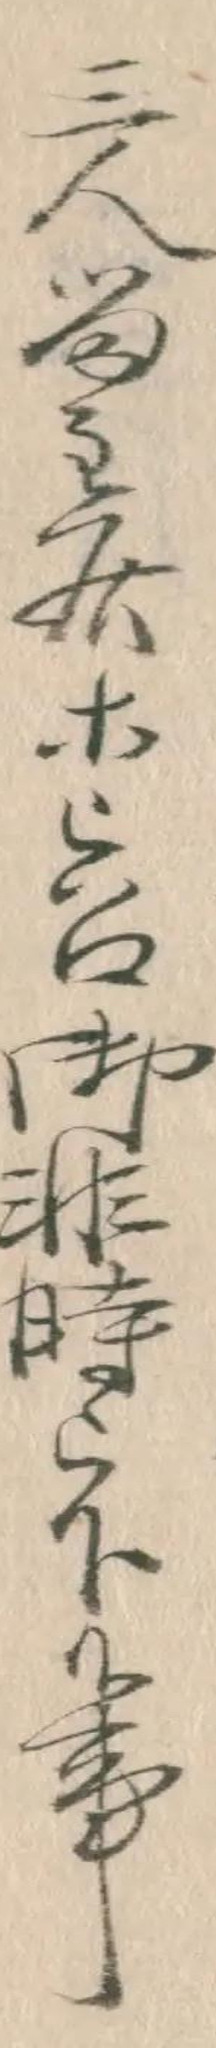三人留主居等被召御非時被下候事
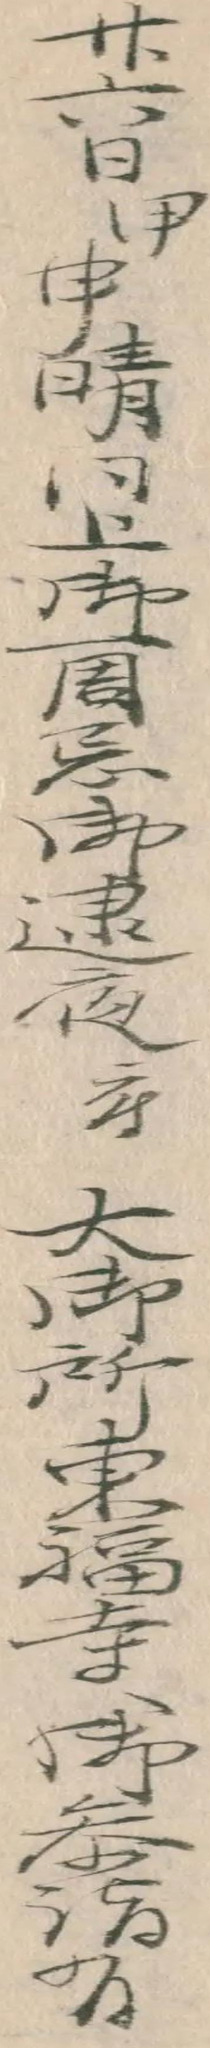廿六日甲申晴同上御一周忌御逮夜ニ付大御所東福寺へ御参詣有
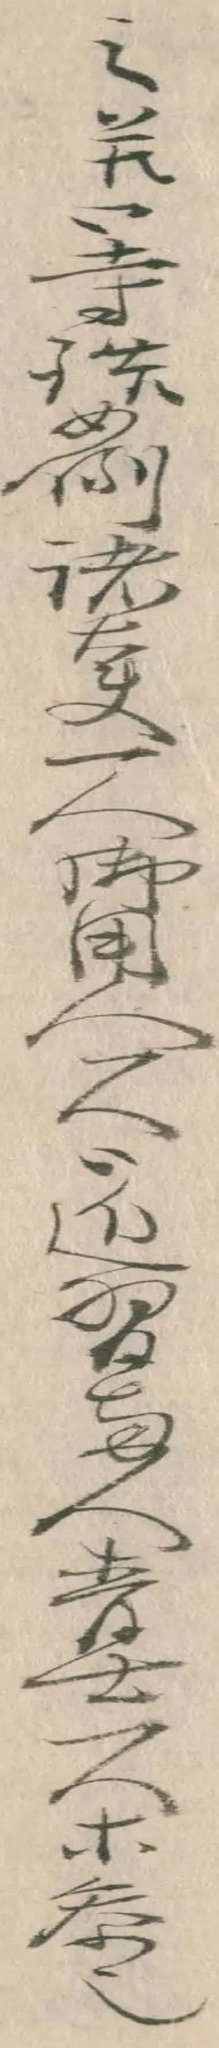之并御寺詰如例諸大夫一人御用人一人御近習両人青士一人等参也
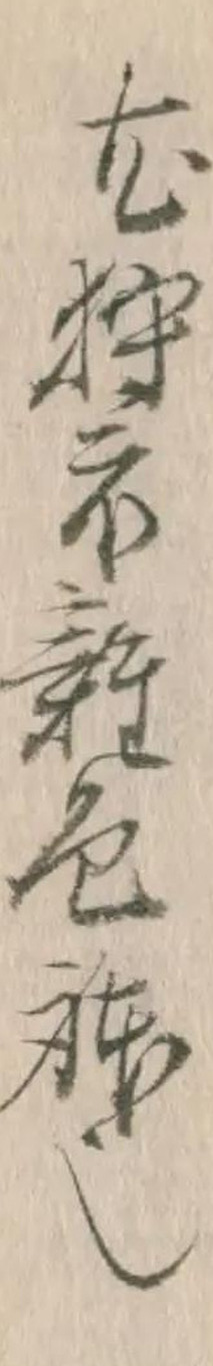尤狩京雑色躰也
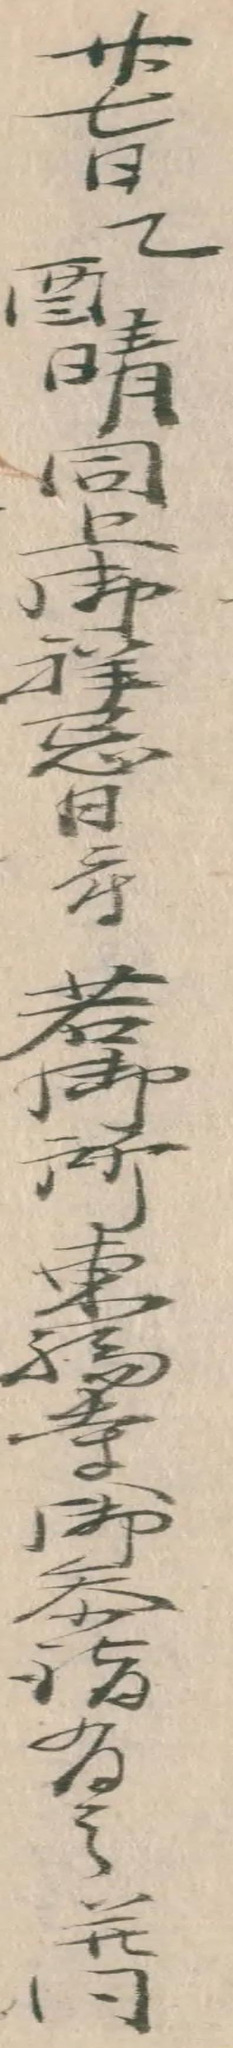廿七日乙酉晴同上御祥忌日ニ付若御所東福寺御参詣有之并同
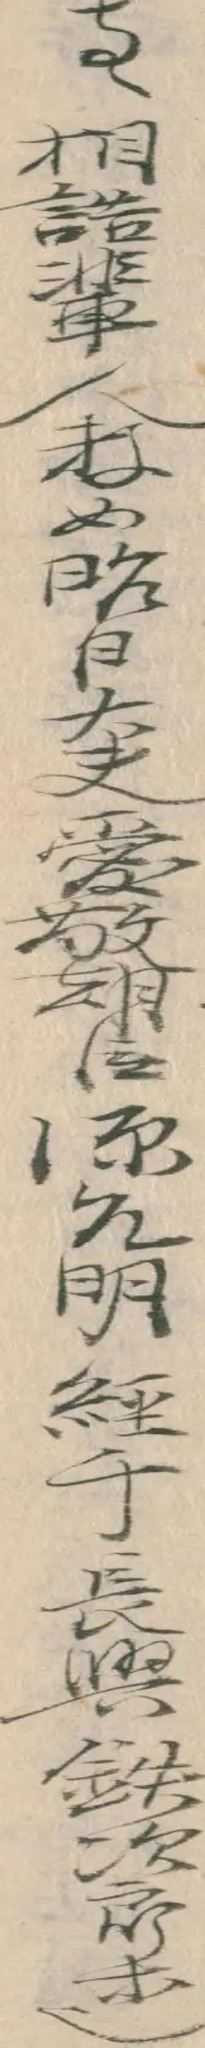寺へ相詰輩人数如昨日大夫安敬朝臣源所明経千長興銀次郎等也
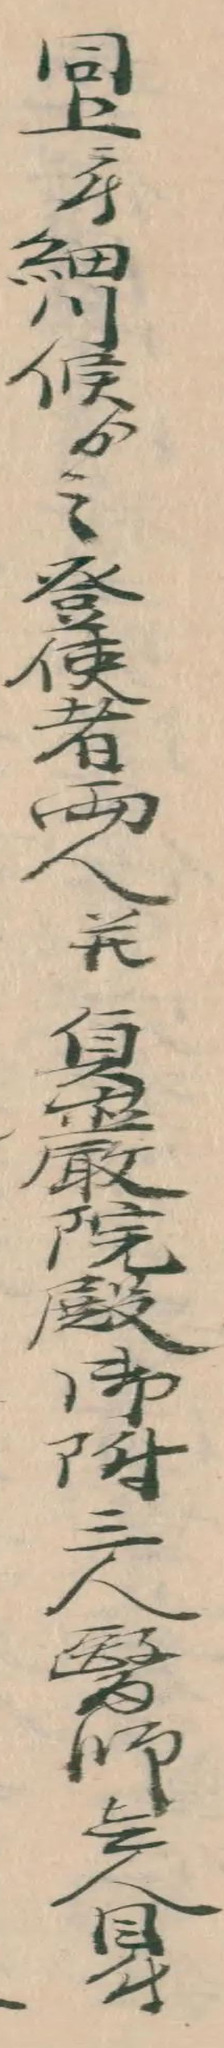同上ニ付細川侯ゟ之登使者両人并貞巌院殿御附三人醫師壱人目付
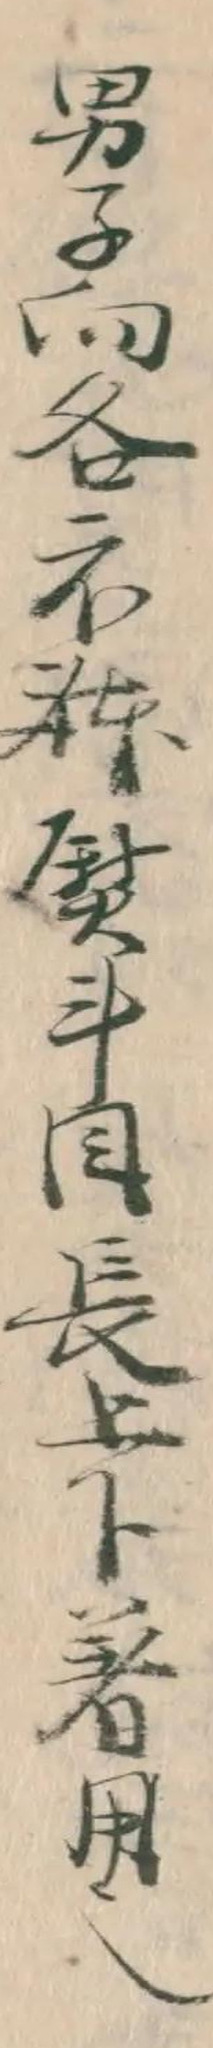男子向各不躰熨斗目長上下着用也
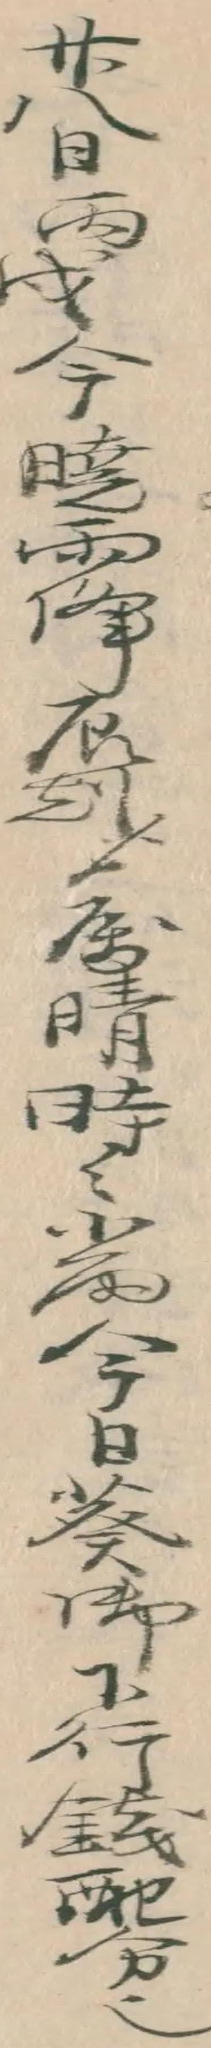廿八日丙申今暁雨降辰刻ゟ属晴時々小雨今日葵御下行銭配分也
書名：賀茂社記録. 第65冊
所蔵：国立国会図書館 National Diet Library, JAPAN
